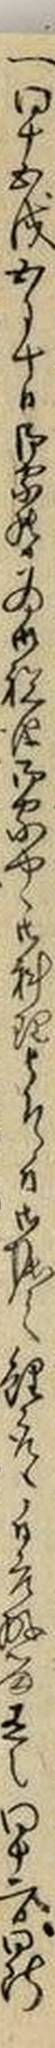一同十五戌五月十日御家督為御祝儀御家中へ御料理被下候に付御堀之鯉取候に付取扱留有之同十二日同断
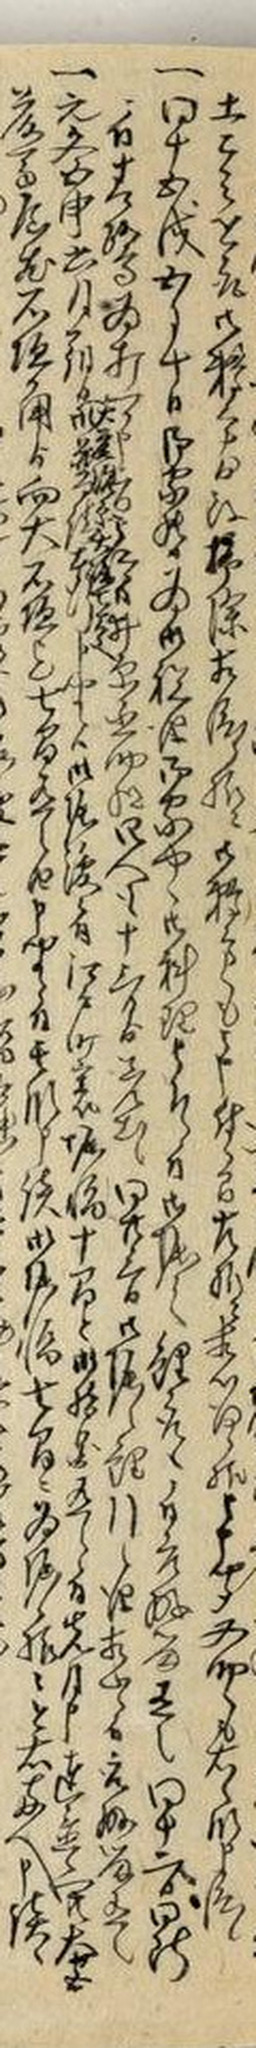に付青鷺為打可申旨被仰候付井原丞助組四人ツヽ十三日ゟ差出候同廿三日御堀之鯉引之儀相止候に付取扱留有之
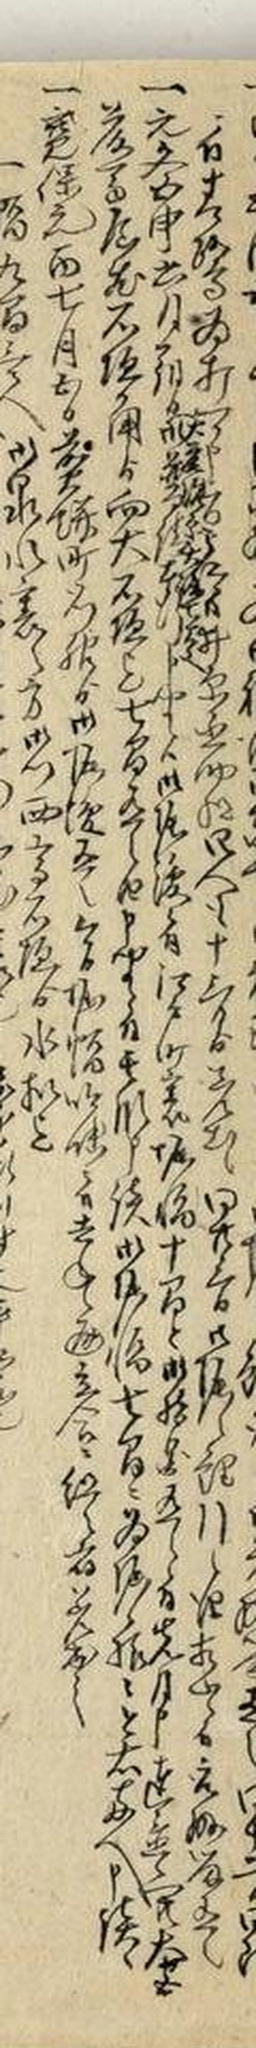藤馬屋敷石垣角ゟ向大石垣迄七間有之由申聞候に付其段申談御堀幅七間に為掘候様にと右両人申談候
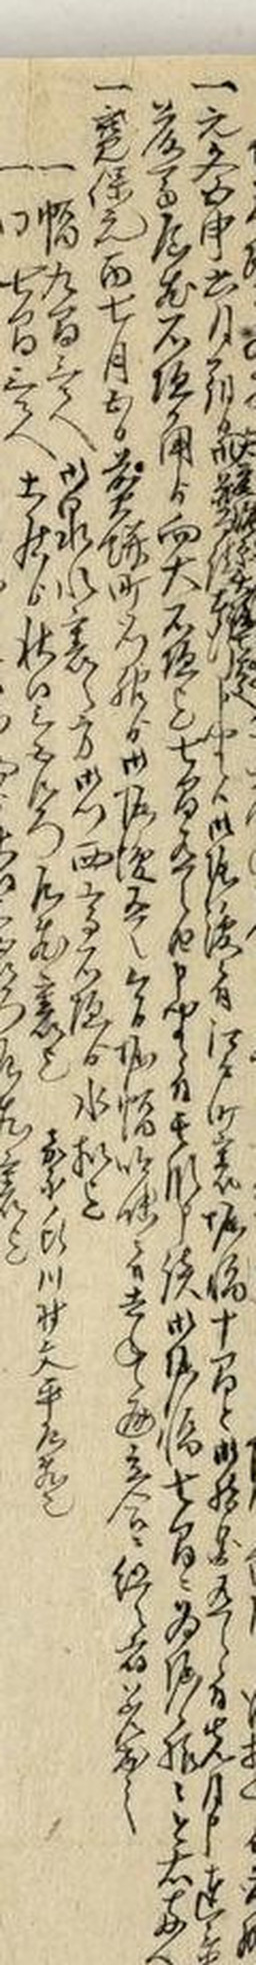一寛保元酉七月五日煎餅町御門脇ゟ御堀浚有之今日堀幅吟味に付去年之通立合に組之者差出之
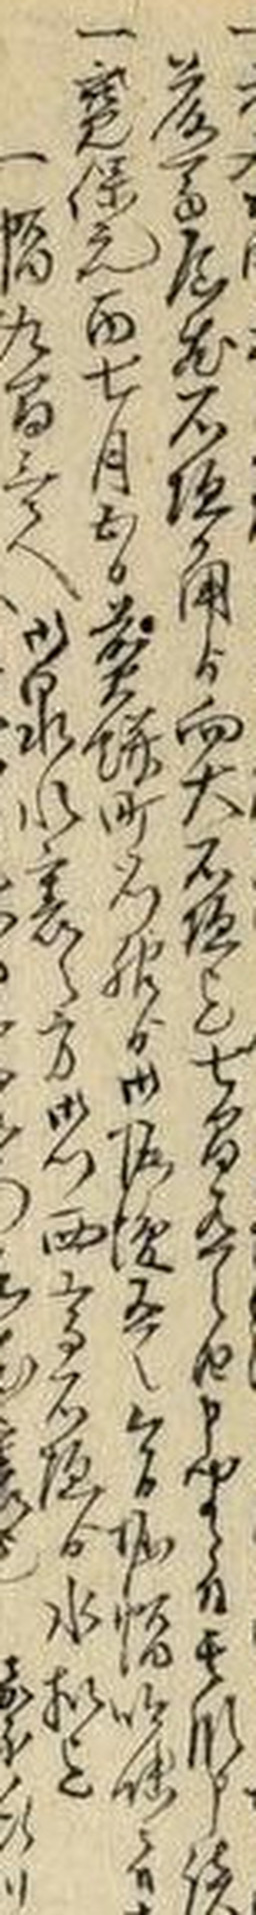一幅九間三尺御泉水裏之方御門西高石垣ゟ水扣迄
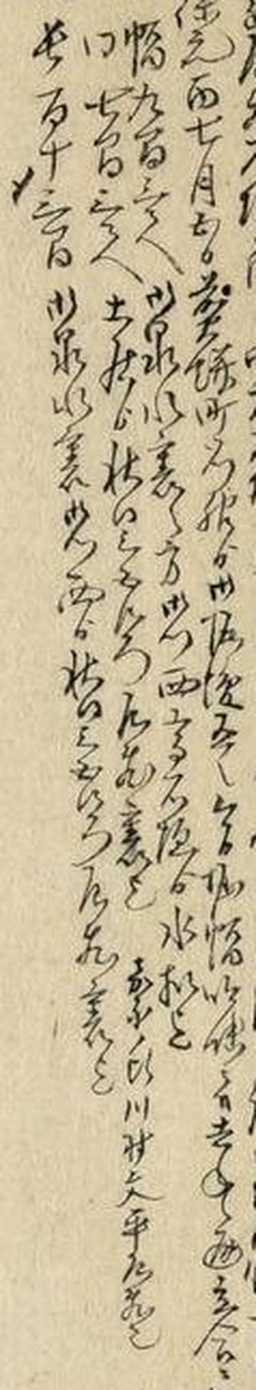一同七間三尺土居ゟ秋田三五左衛門屋敷裏迄嘉永ノ頃川村文平屋敷也
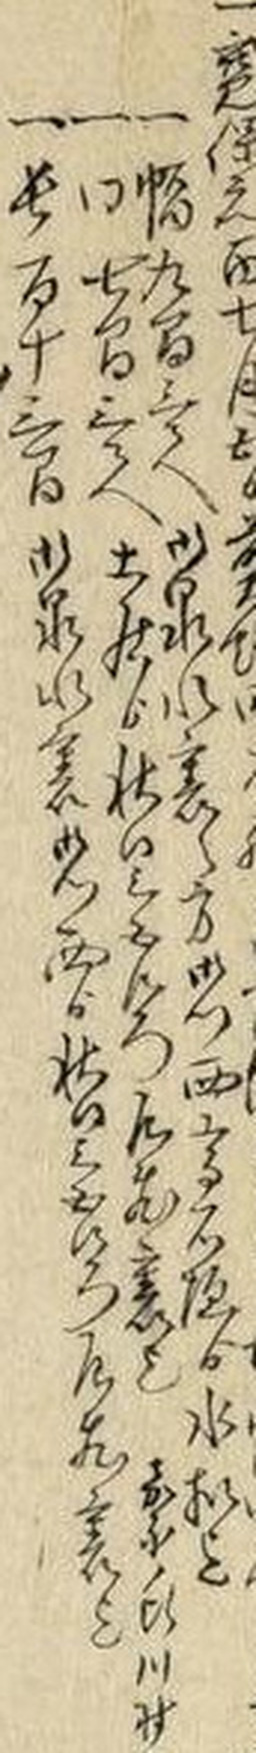一長百十三間御泉水裏御門西ゟ秋田三五左衛門屋敷裏迄

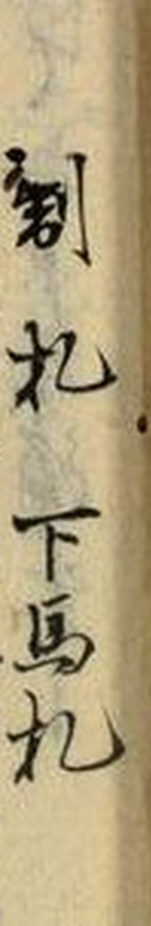制札下馬札
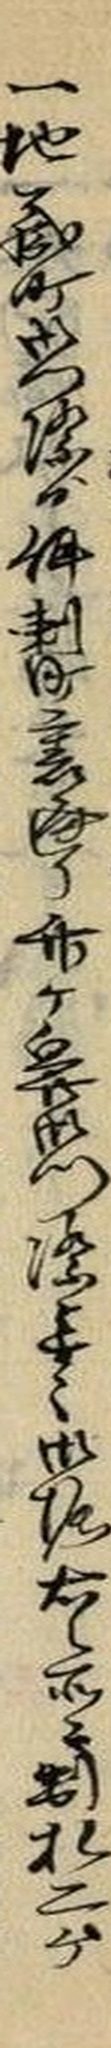一地蔵町御門際ゟ餌刺町裏通り竹ケ鼻御門際迄之御堀右之所に制札二ケ
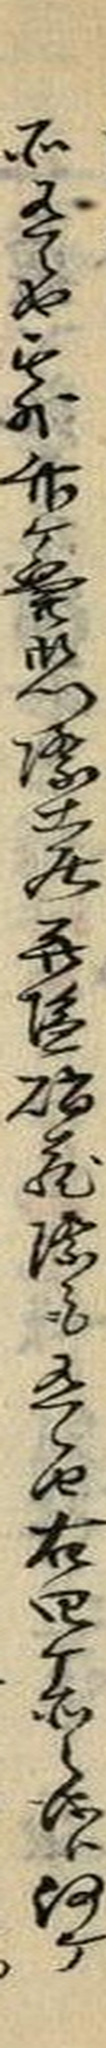所有之由其外竹ケ鼻御門際土居并塩硝蔵際にも有之由右四ケ所之儀は何ケ
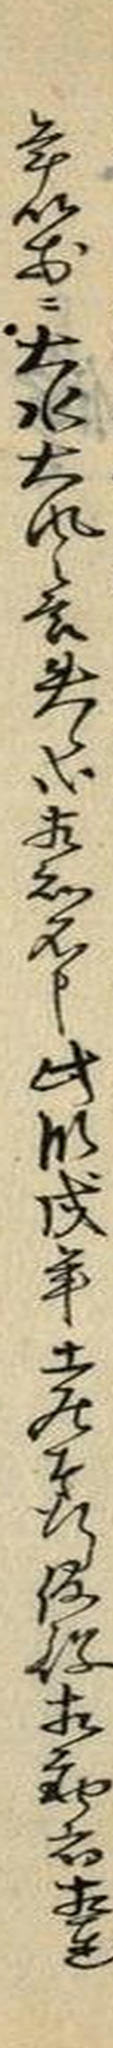年以前に大水大風之節失候哉相知不申此段戌年土居奉行仮役相勤候者相達
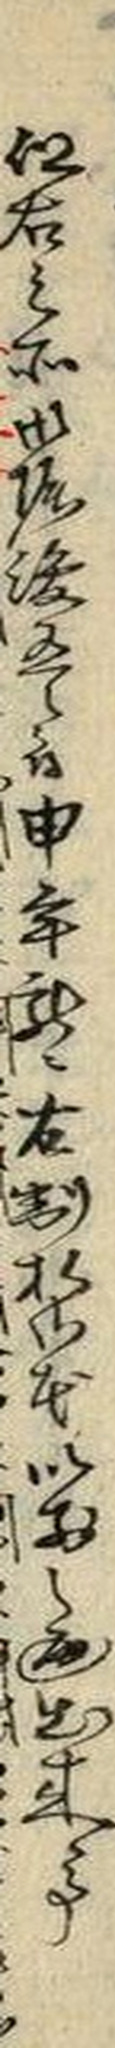但右之所御堀浚有之に付申年新に右制札弐本以前之通出来候事
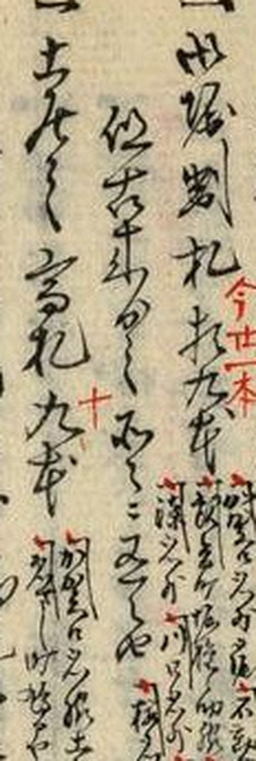但古来ゟ所々に有之由
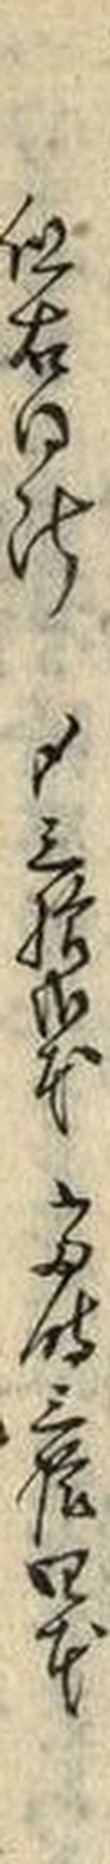但右同断〆三拾弐本当時三拾四本
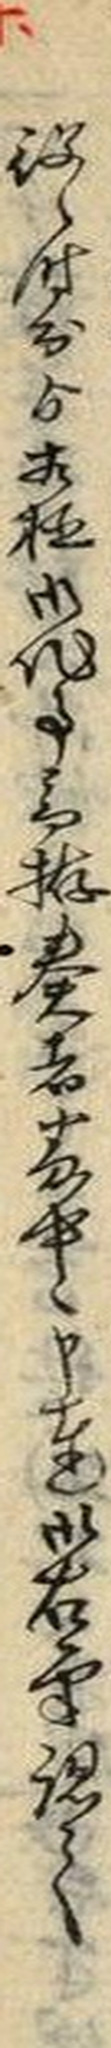役之時分ゟ相極御作事にて拵奏者番中へ申達御右筆認之

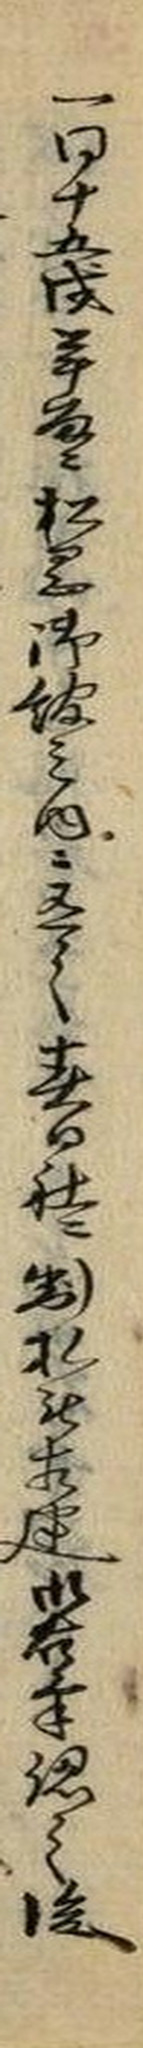一同十五戌年留に松岡御館之内に有之春日社に制札被相建御右筆認之後
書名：御城下諸事之部
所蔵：福井県文書館 Fukui Prefectural Archives
